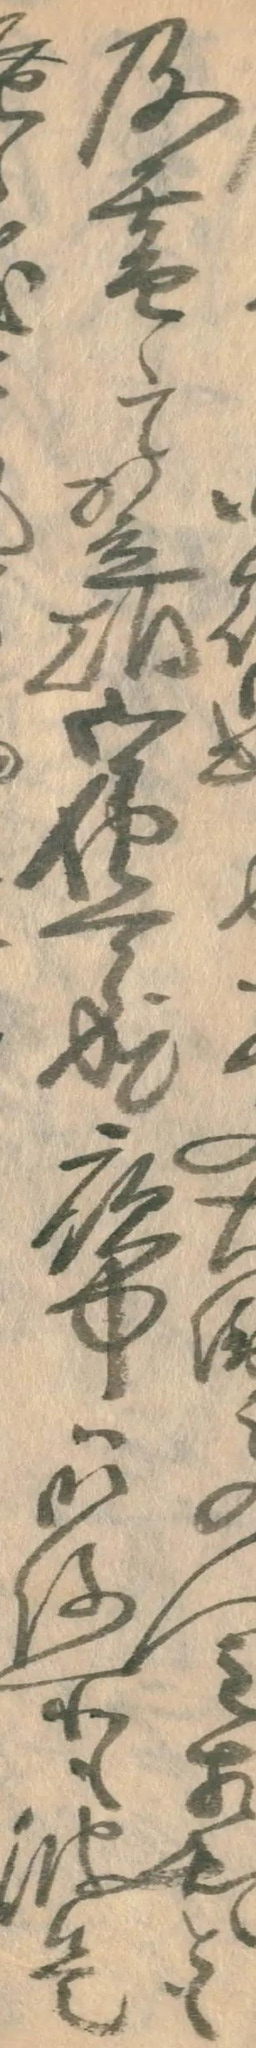及暮候て翌朝御届可被成候夜中ハ御役所も彼是
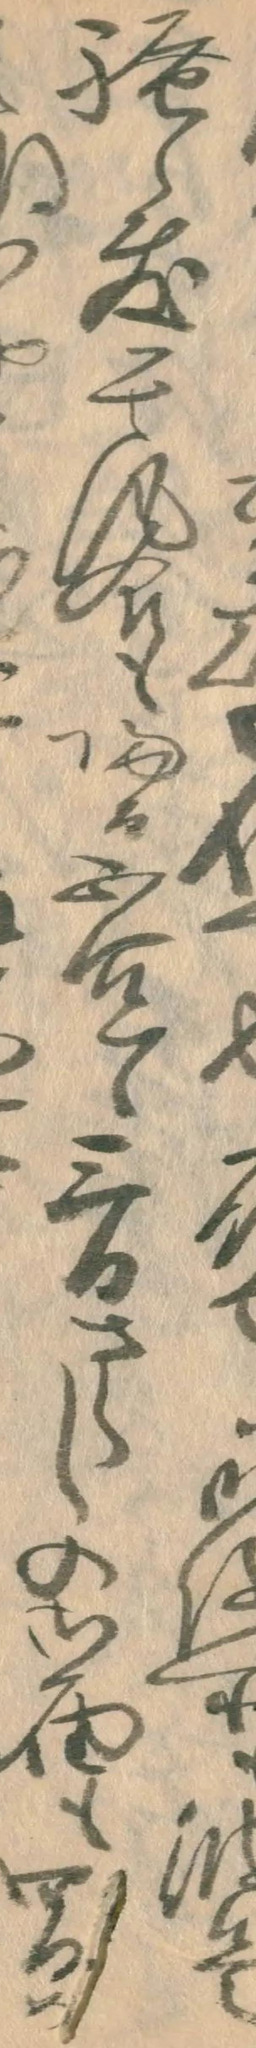騒々敷其風合も帰而不宜候三日さらしの御届も四日め
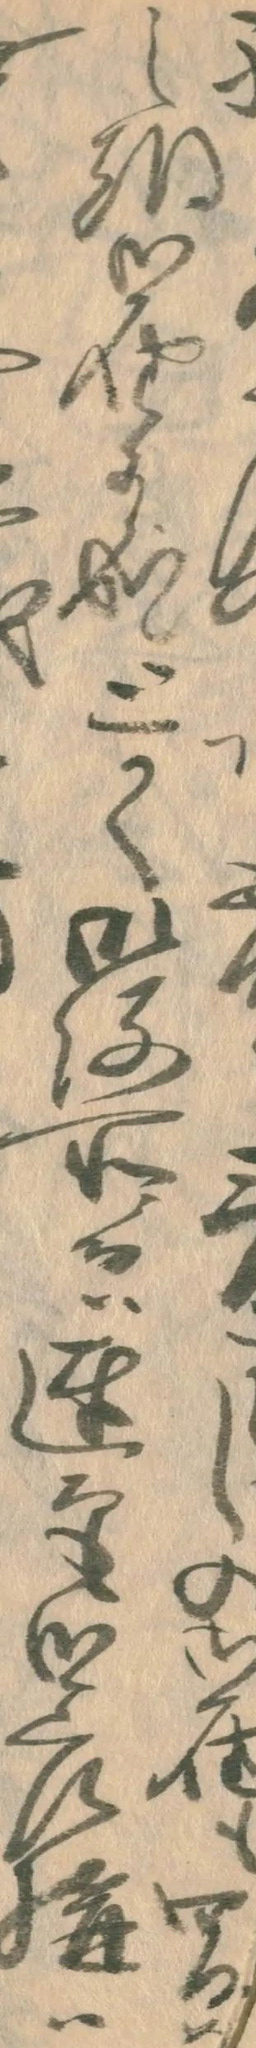之朝御届に被成候とかく御役所ニ而ハ達而も御差構ハ
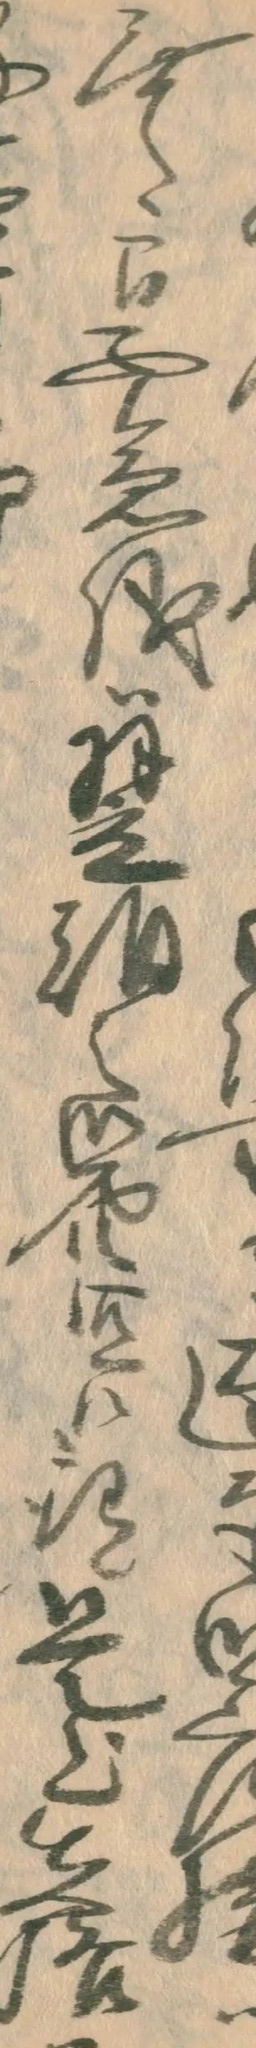無之候間不急儀ハ翌朝之御届宜御座候是迄先格ハ
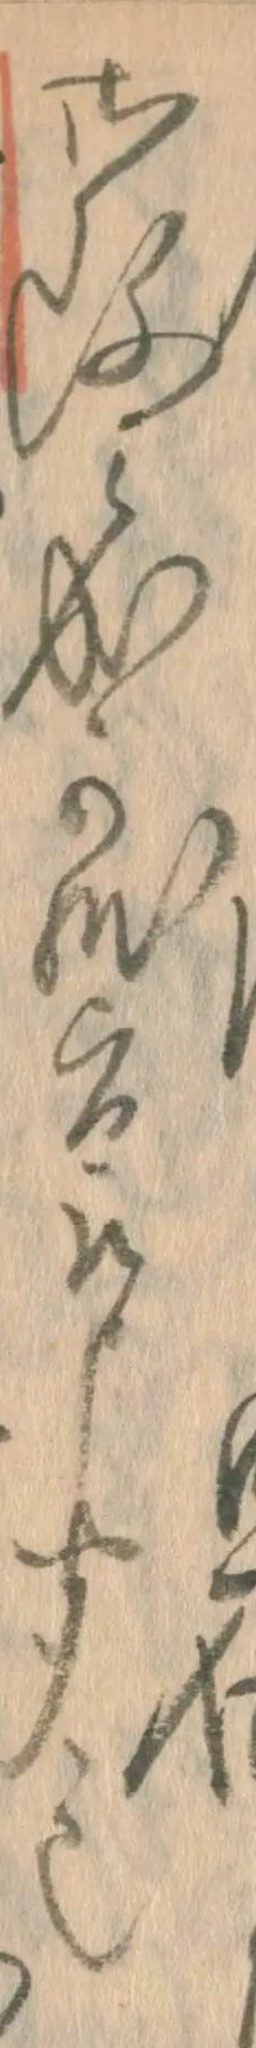御改被成可然旨被申聞候也
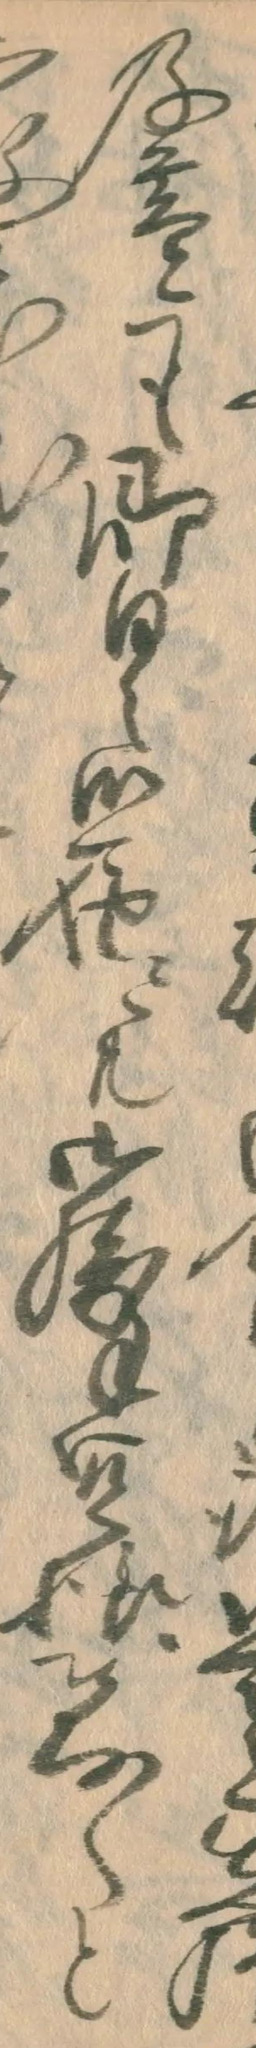及暮候ても即日之御届ニ候共御勝手宜様奉存候と
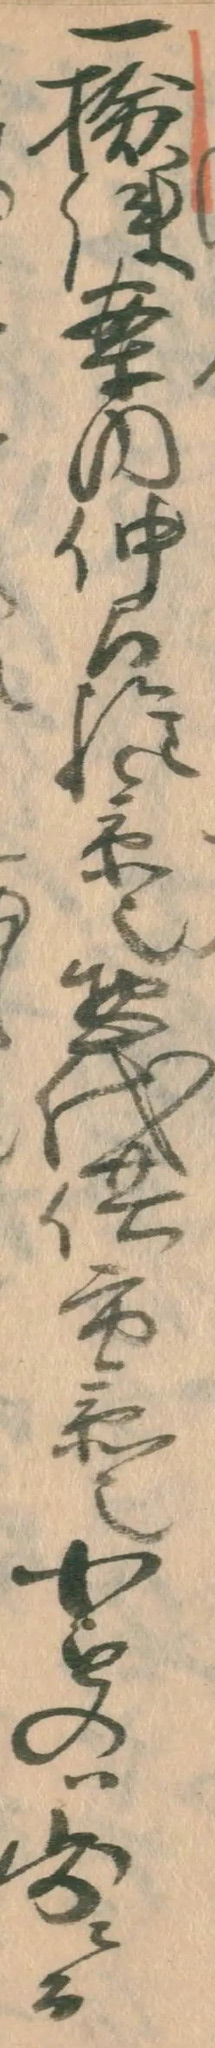一検使案内仲間権兵衛也惣代供市兵衛也小ものハ歩ニ而
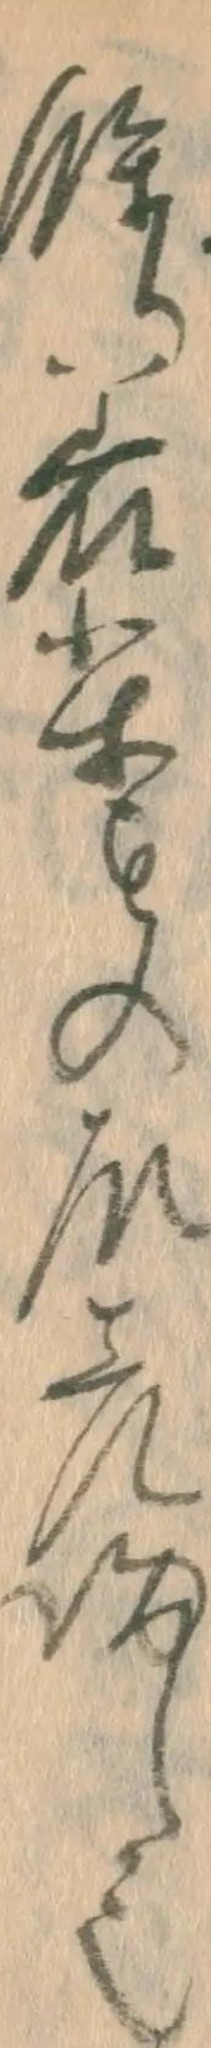余り若輩もの故差し候也
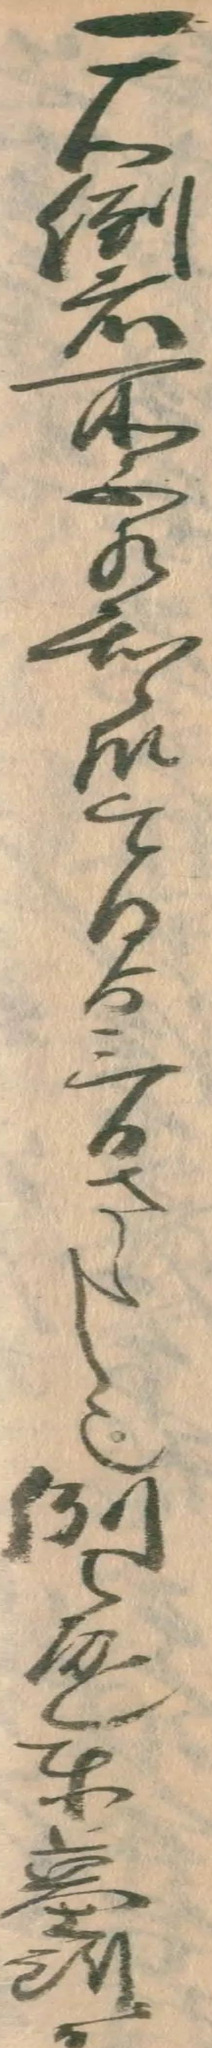一右倒者所不相知候故今日ゟ三日さらし也例之通東墓所ニ而
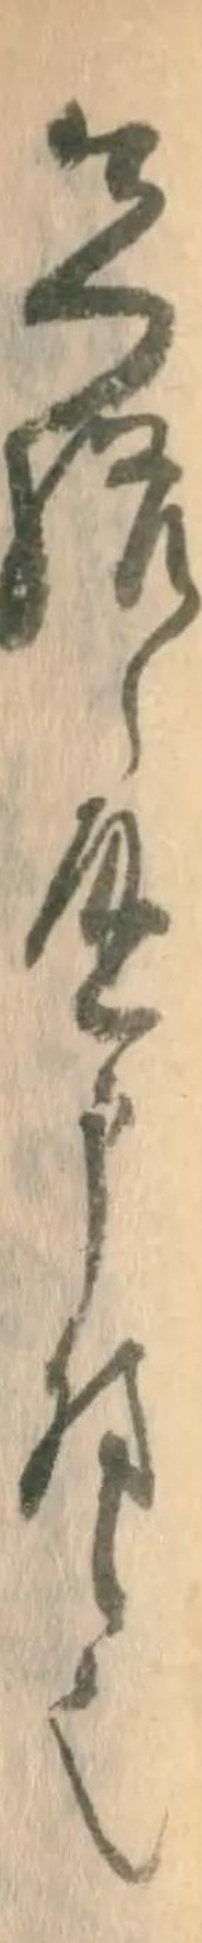先格之通申付候也
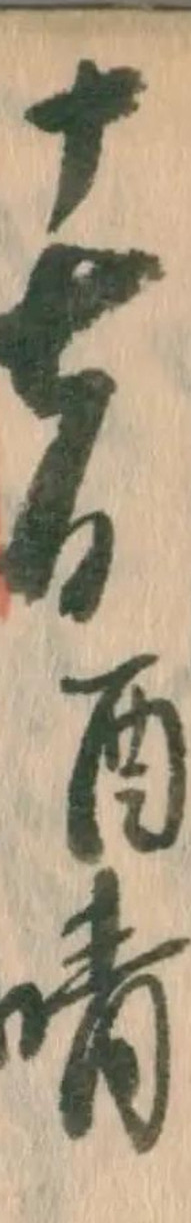十七日酉晴
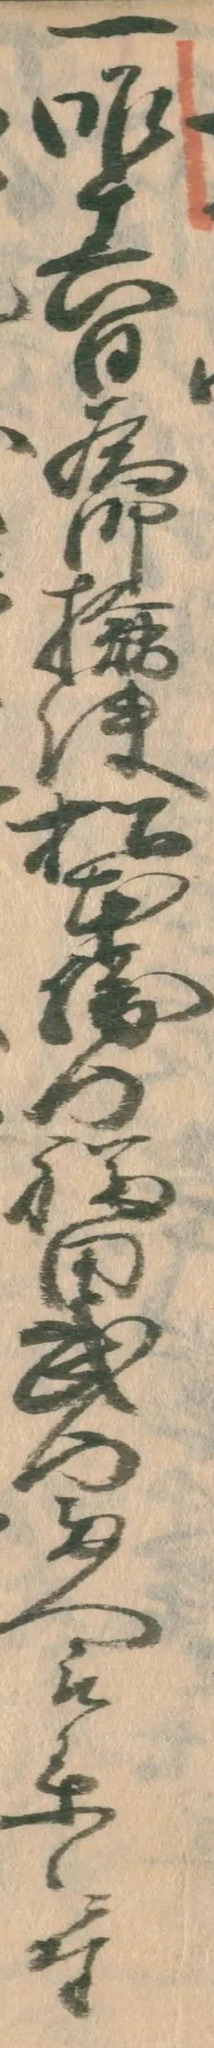一昨十六日為御検使松本勝右衛門福田武右衛門両人被参候ニ付
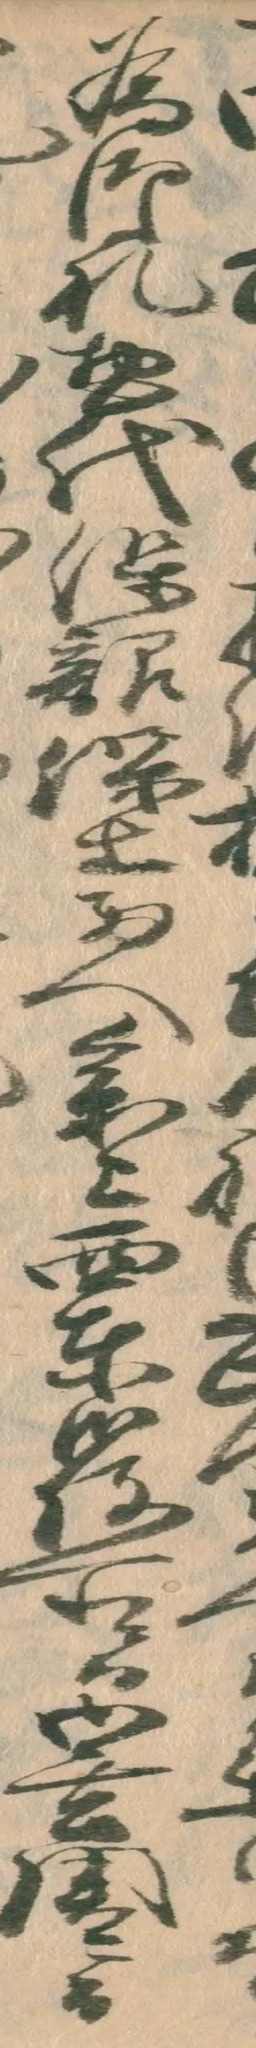為御礼惣代保韶保士両人参上西東御役所ニ而御玄関ニ而
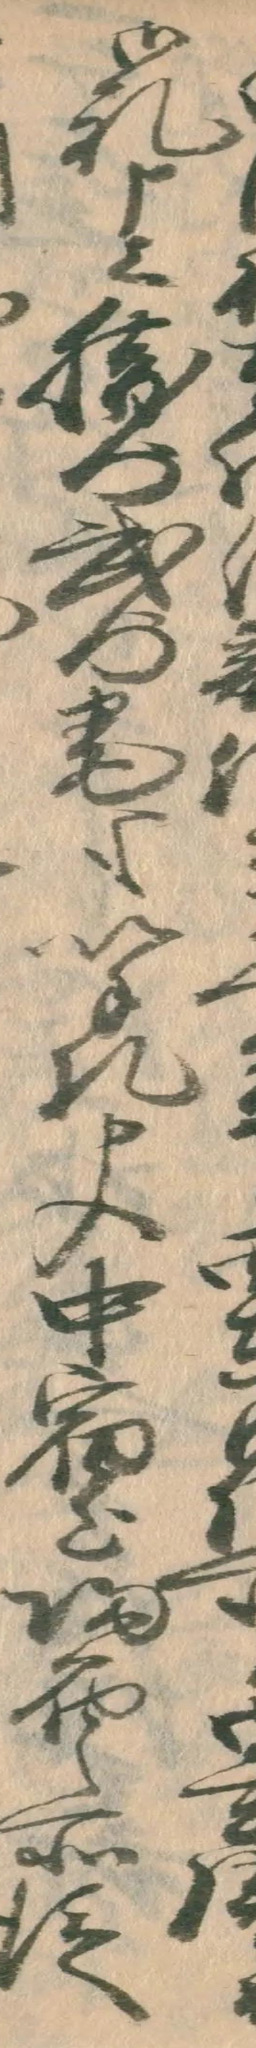御礼申上勝右衛門武右衛門宅へも以手札申入中宿迄帰宿之所従
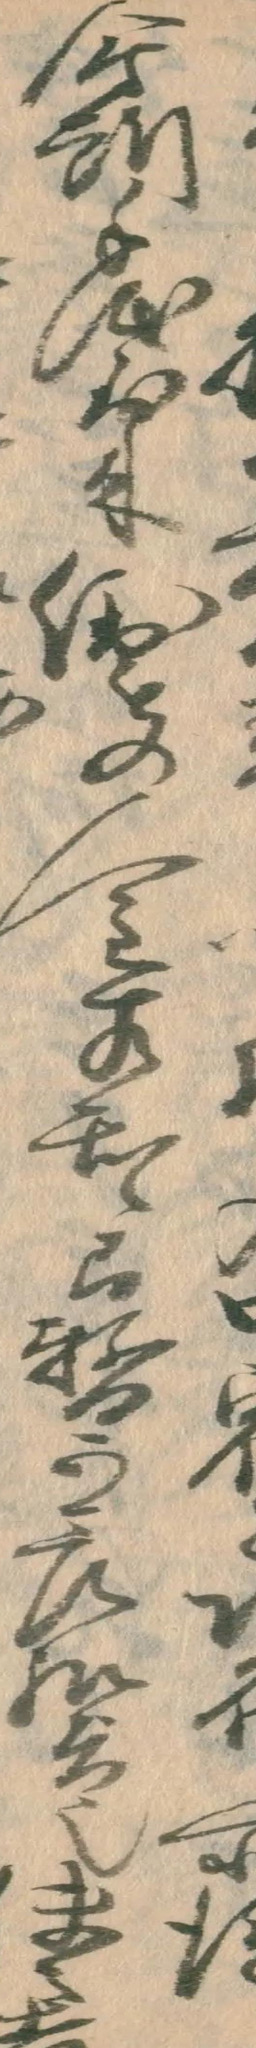会所手紙到来倒もの人主相知候間暫可差扣旨也使之者
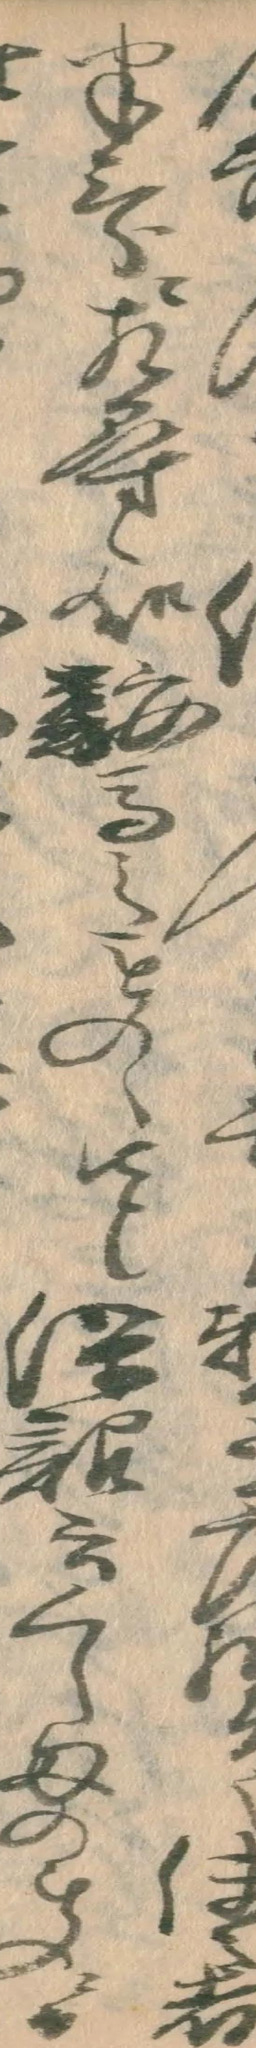半三郎ニ相尋候処鞍馬之ものゝ由申候保韶云くらまのものニ而
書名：賀茂社記録. 第60冊
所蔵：国立国会図書館 National Diet Library, JAPAN
